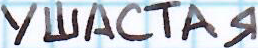ушастая
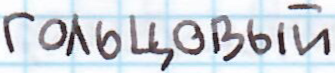гольцовый
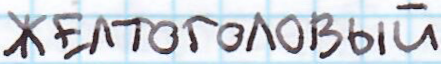желтоголовый
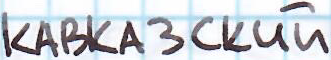кавказский
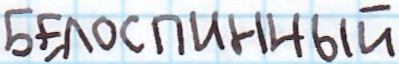белоспинный
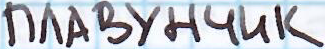плавунчик
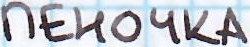пеночка
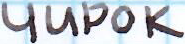чирок
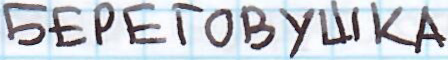береговушка
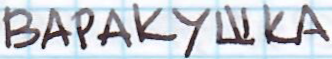варакушка
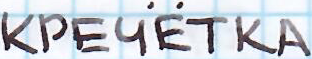кречётка
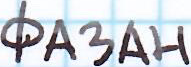фазан
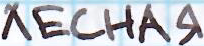лесная
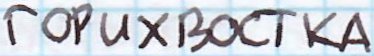горихвостка
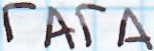гага
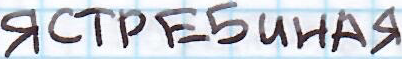ястребиная
